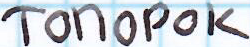топорок
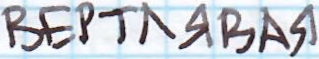вертлявая
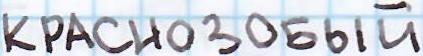краснозобый
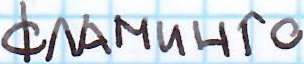фламинго
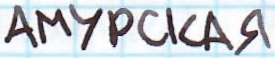амурская
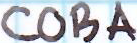сова
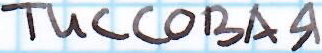тиссовая
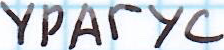урагус
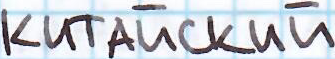китайский
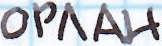орлан
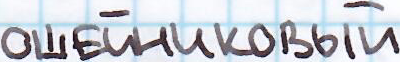ошейниковый
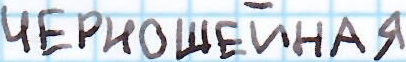черношейная
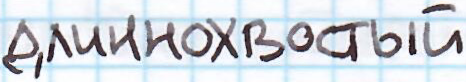длиннохвостый
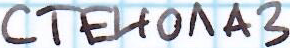стенолаз
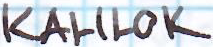канюк
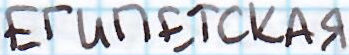египетская
